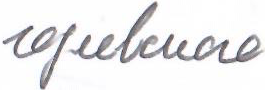годлевского
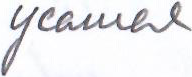усатая
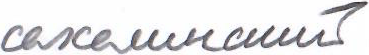сахалинский
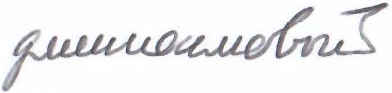длинноклювый
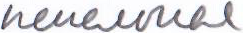пепельная
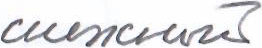снежный
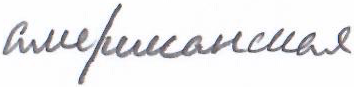американская
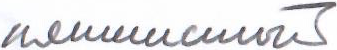пятнистый
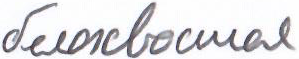белохвостая
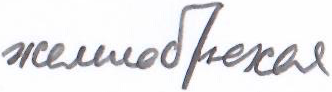желтобрюхая
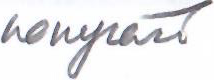попугай
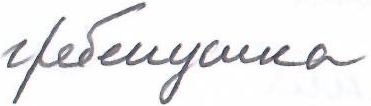гребенушка
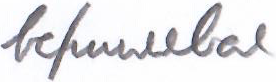вертлявая
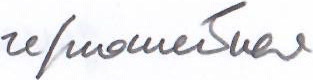черношейная
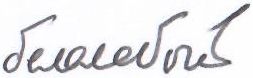белолобый
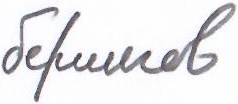берингов
